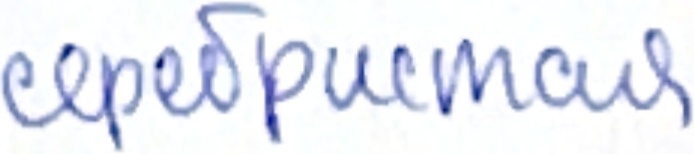серебристая
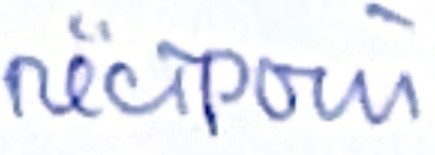пёстрый
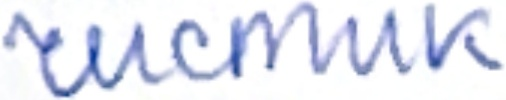чистик
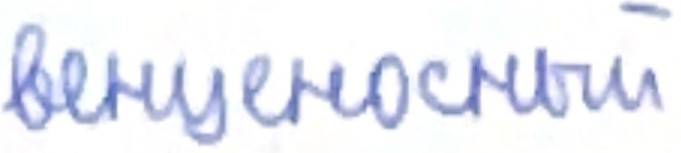венценосный
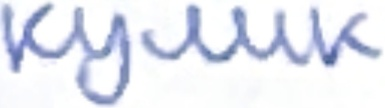кулик
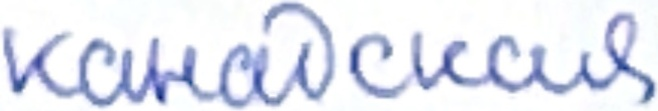канадская
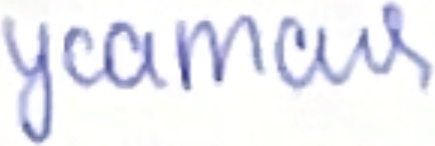усатая
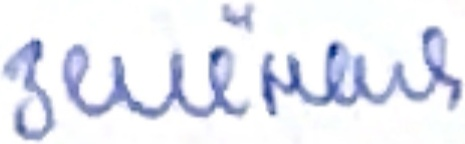зелёная
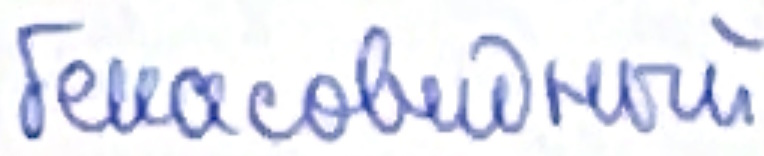бекасовидный
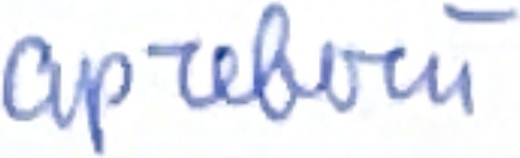арчевый
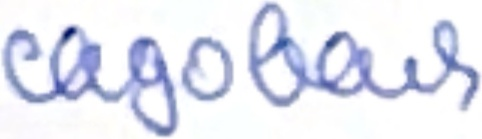садовая
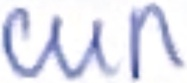сип
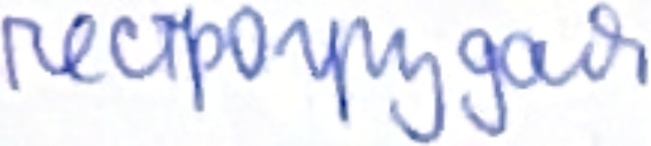пестрогрудая
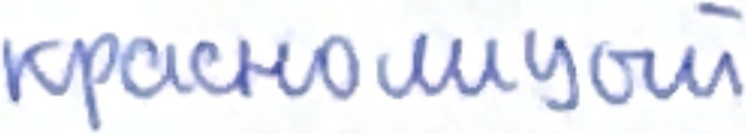краснолицый
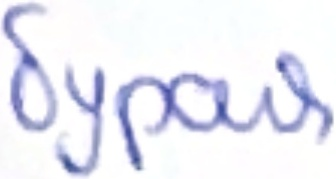бурая
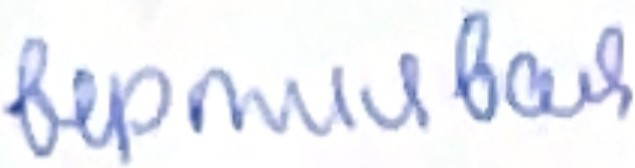вертлявая
